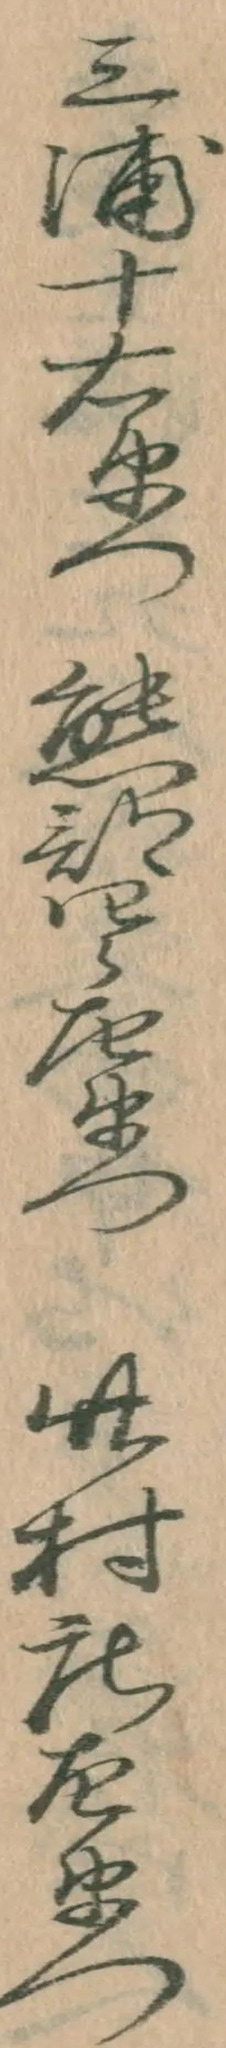三浦十右衛門熊部四郎左衛門井村庄左衛門
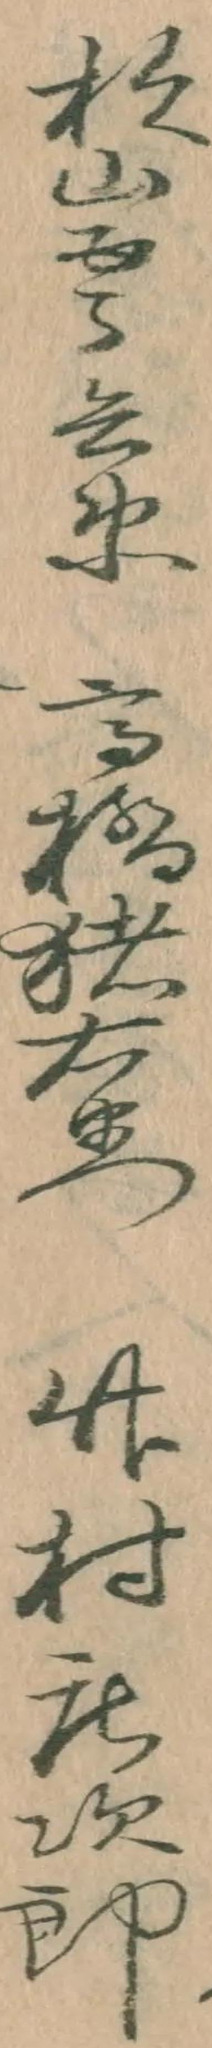杉山五郎兵衛高橋猪右衛門井村庄次郎
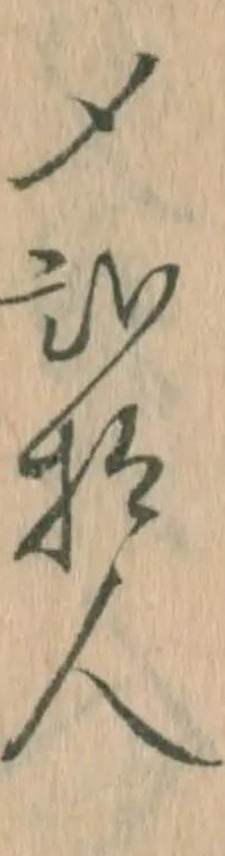〆弐拾人
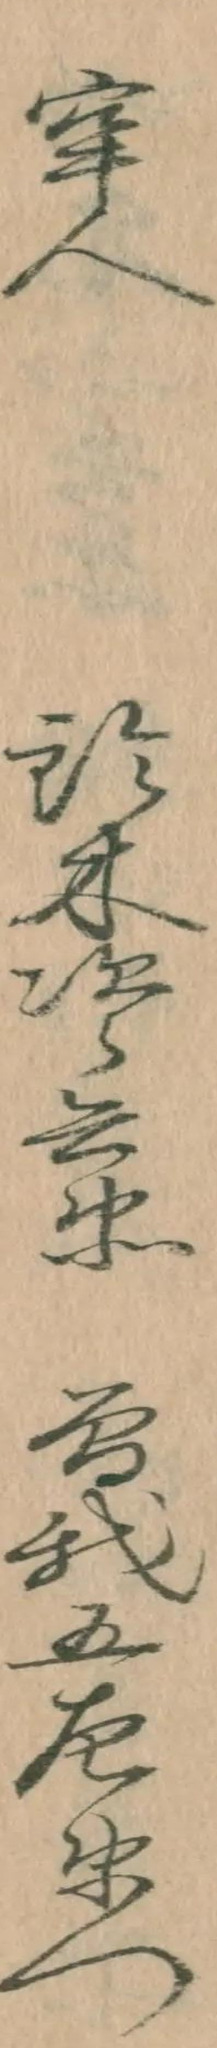牢人鈴木次郎兵衛曽我五左衛門
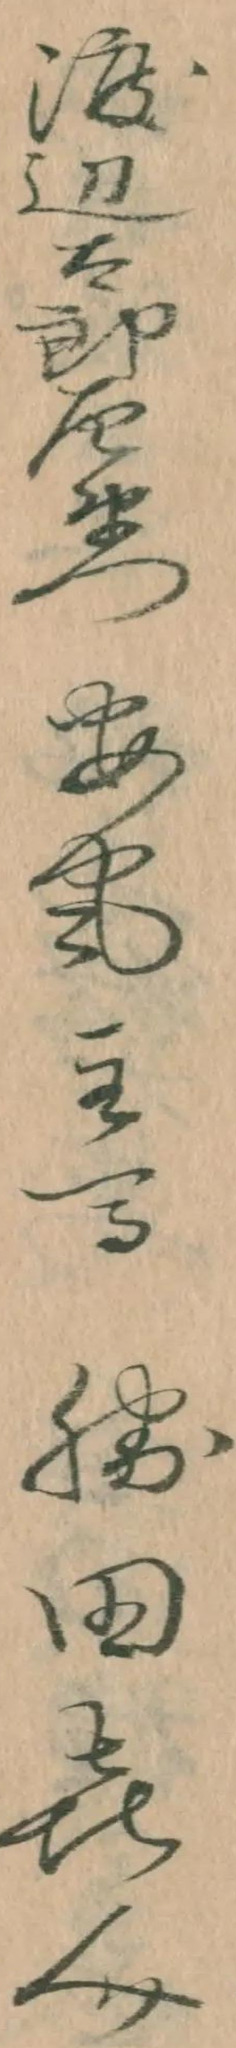渡辺太郎左衛門安宅主馬勝田喜介
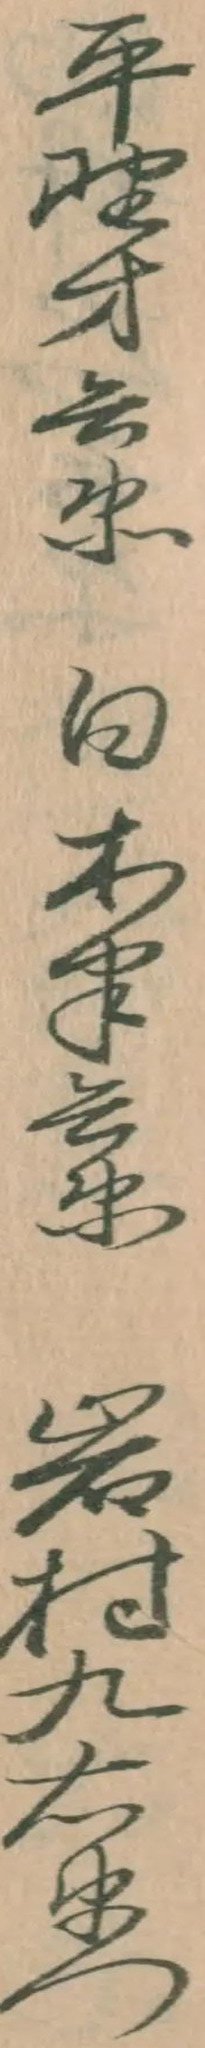平野才兵衛白木半兵衛岩村九右衛門
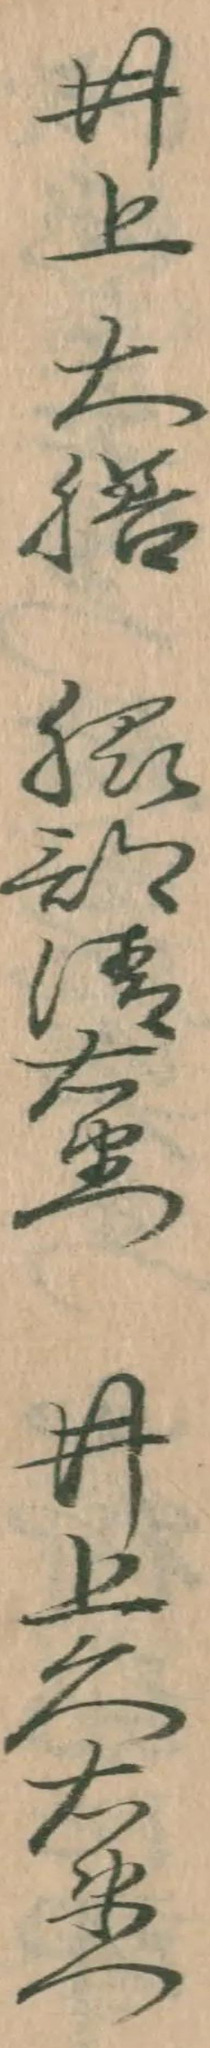井上大膳脇部清右衛門井上久右衛門
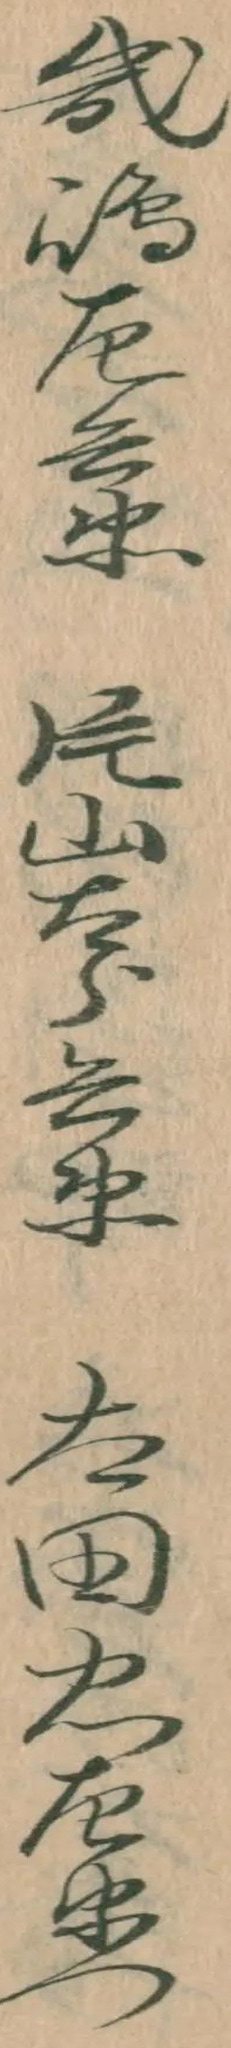幾島左兵衛片山太郎兵衛太田忠左衛門
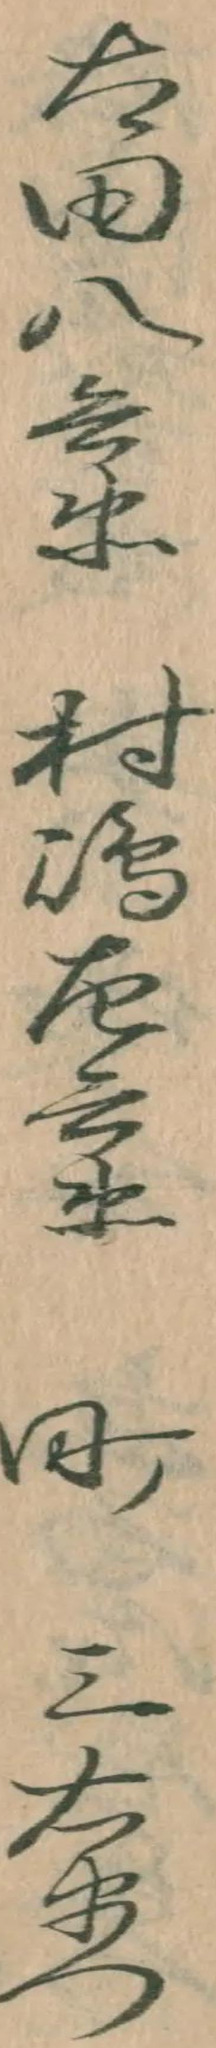太田八兵衛村島左兵衛町三右衛門
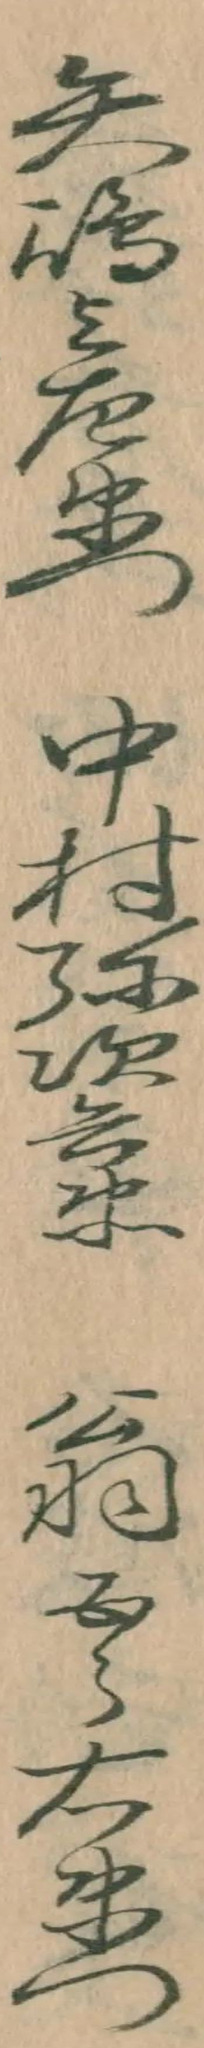矢島与左衛門中村弥次兵衛翁五郎右衛門
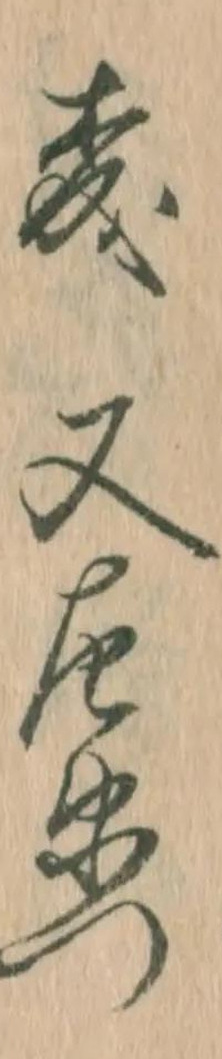森又左衛門
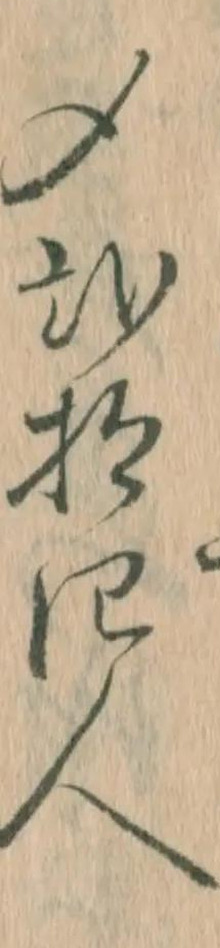〆弐拾四人
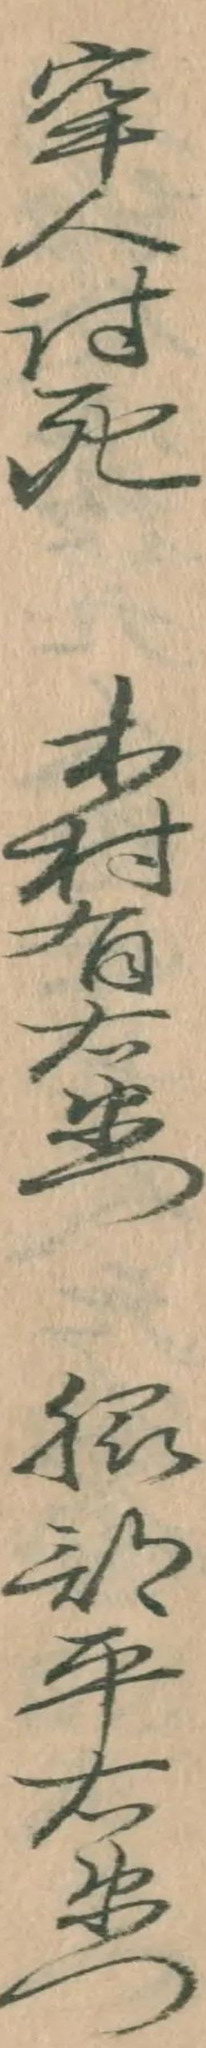牢人討死木村有右衛門脇部平右衛門
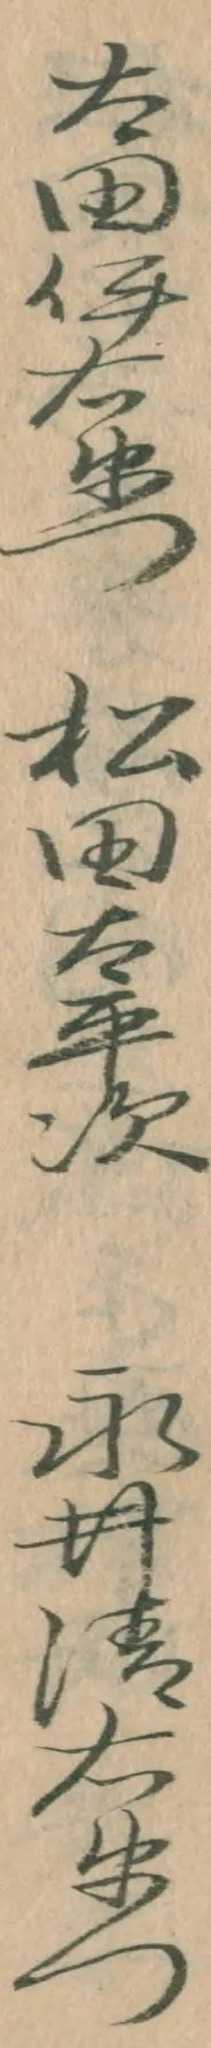太田伊右衛門松田太平次永井清右衛門
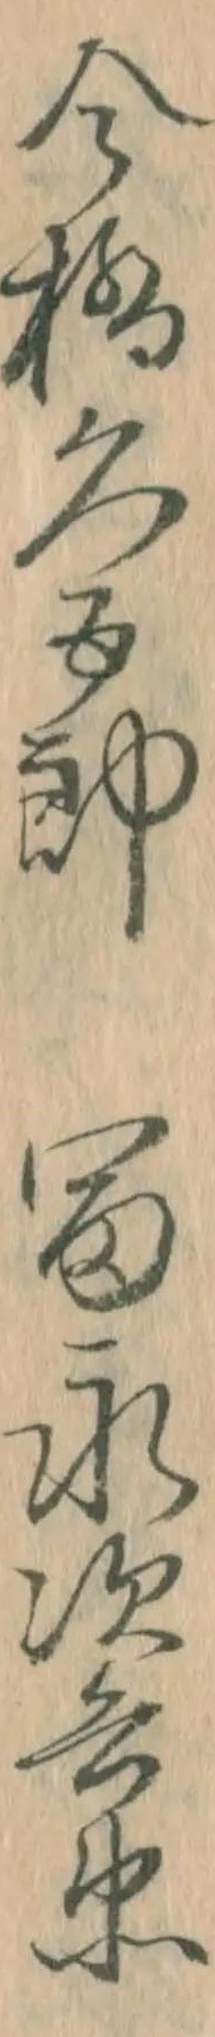今橋久五郎冨永次兵衛

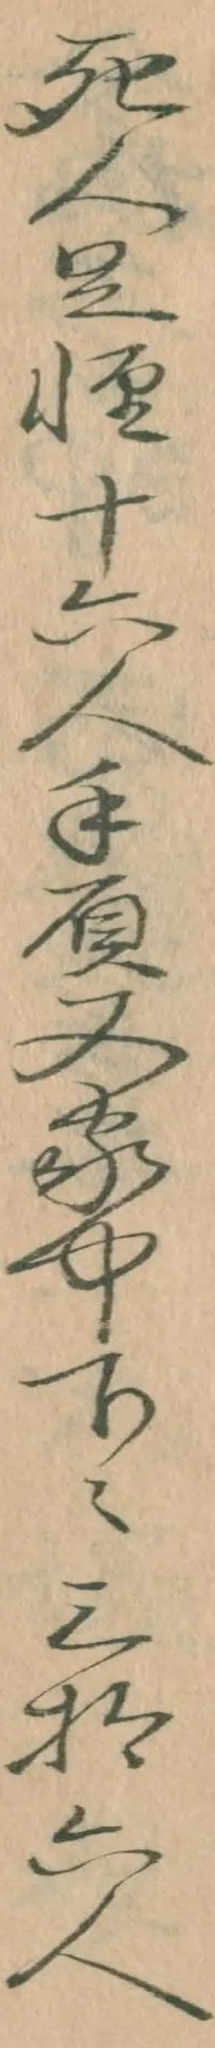死人足軽十六人手負又家中下々三拾六人
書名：切支丹御退治記 49巻. [9]
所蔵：国立国会図書館 National Diet Library, JAPAN
